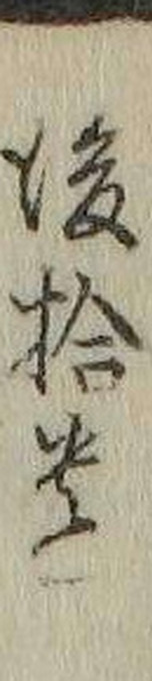後拾遺
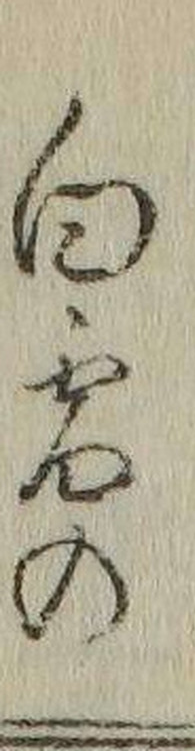白雪の
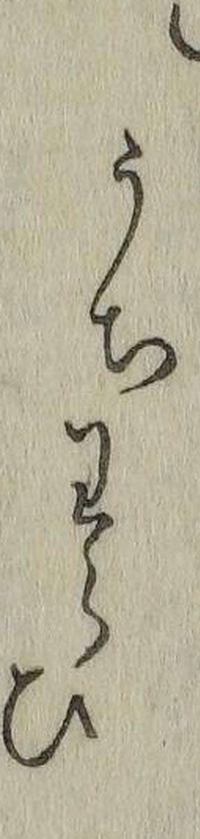うちわらひ
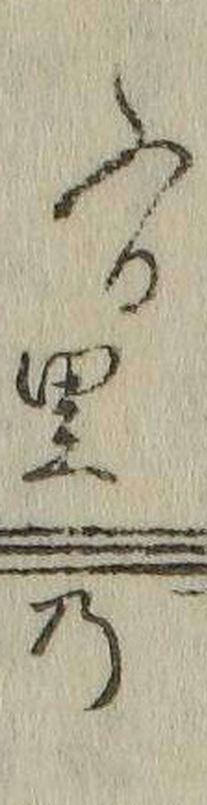ふる里の
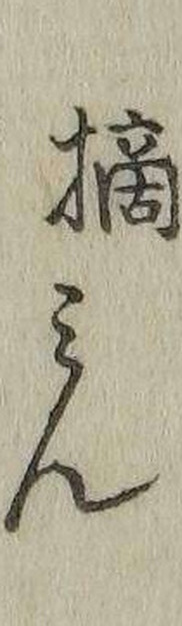摘みん

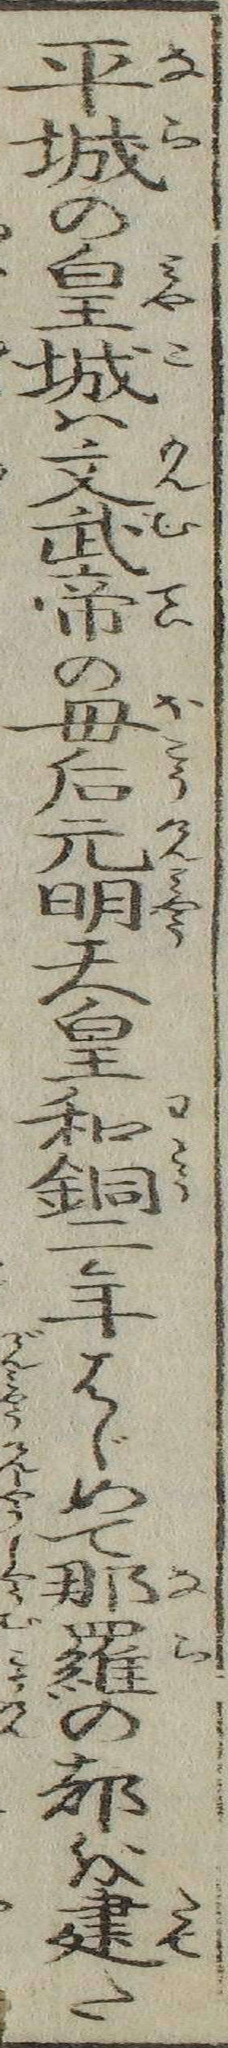平城の皇城は文武帝の母后元明天皇和銅二年はじめて那羅の都を建た
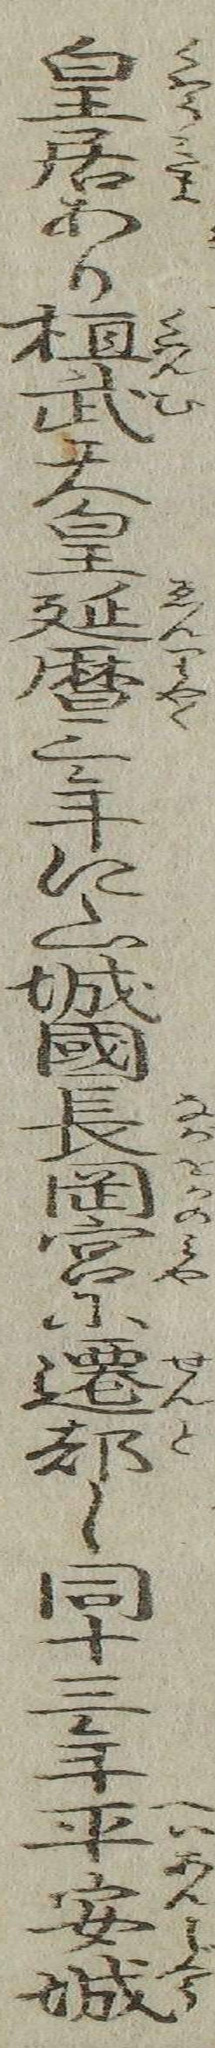皇居あり桓武天皇延暦三年に山城國長岡宮に還都し同十三年平安城
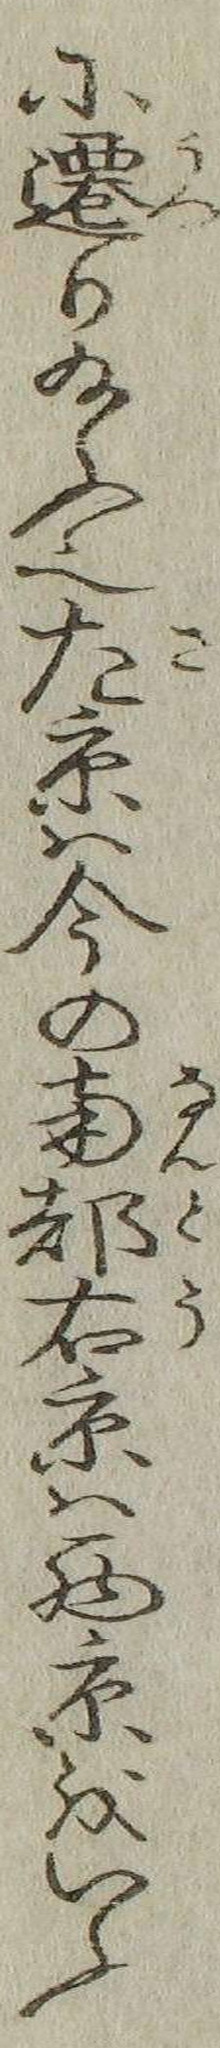に遷り給ふ也左京は今の南都右京は西京をいふ
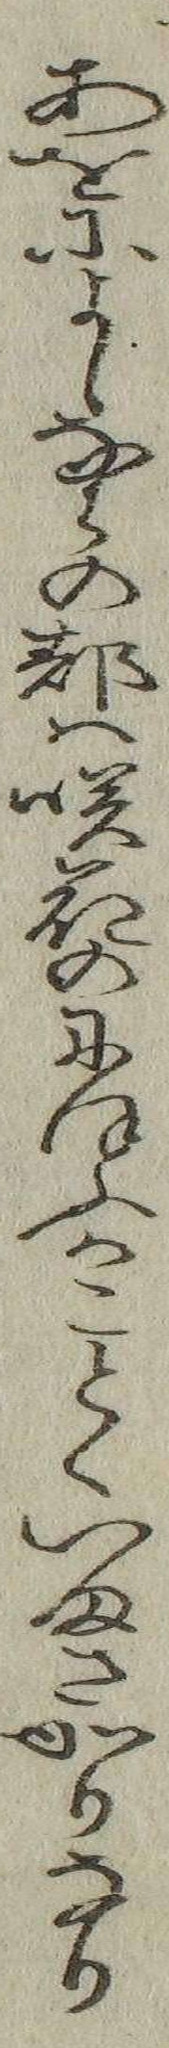あをによしならの都は咲花のにほふかことくいまさかりなり
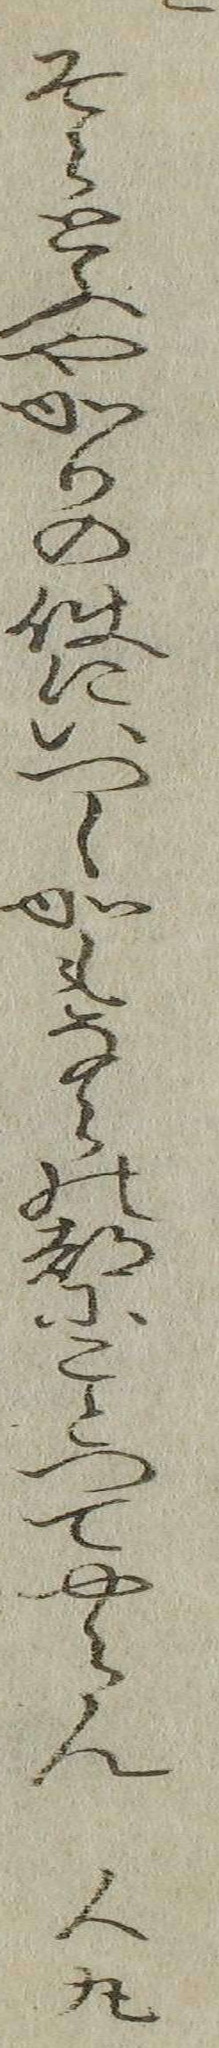そらとふやかりの使にいつしかもならの都にことつてやらん人丸
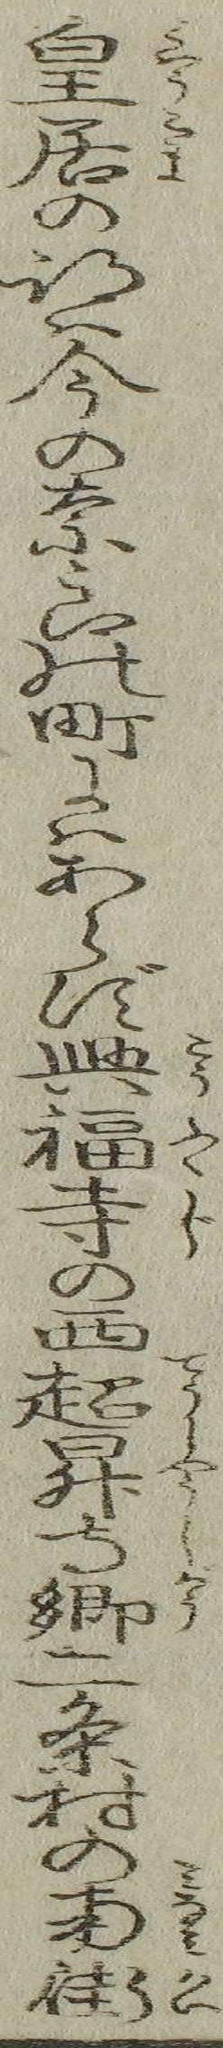皇居の跡は今の奈良の町にはあらず興福寺の西超昇寺郷二条村の南街
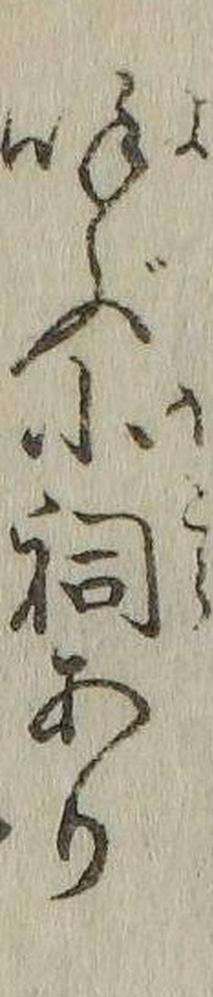呼ぶ小祠あり
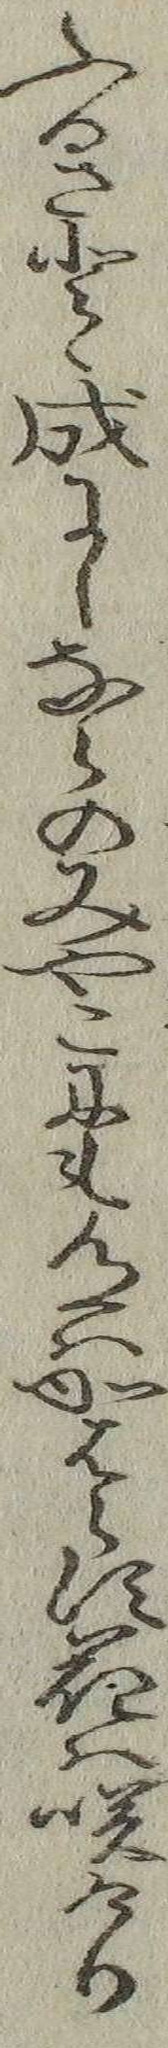ふるさとゝ成にしならのみやこにも色はかはらす花は咲けり
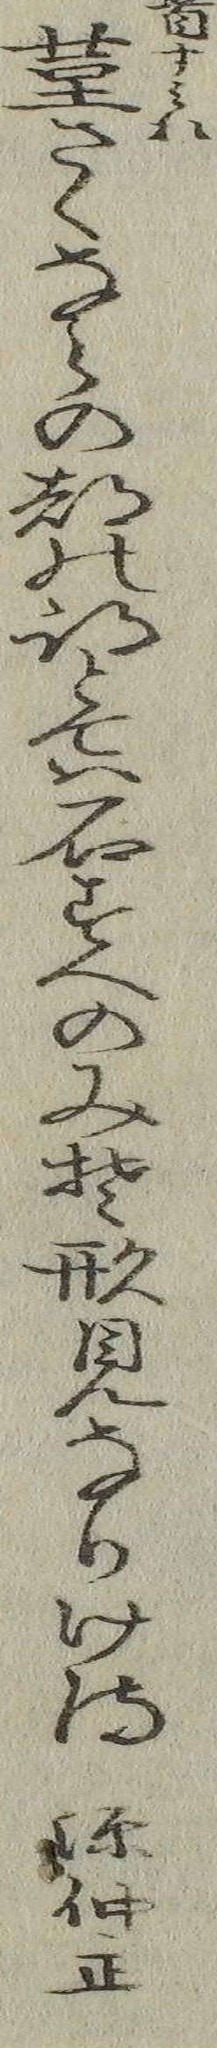菫さくならの都の跡とては石すへのみそ形見なりける源仲正
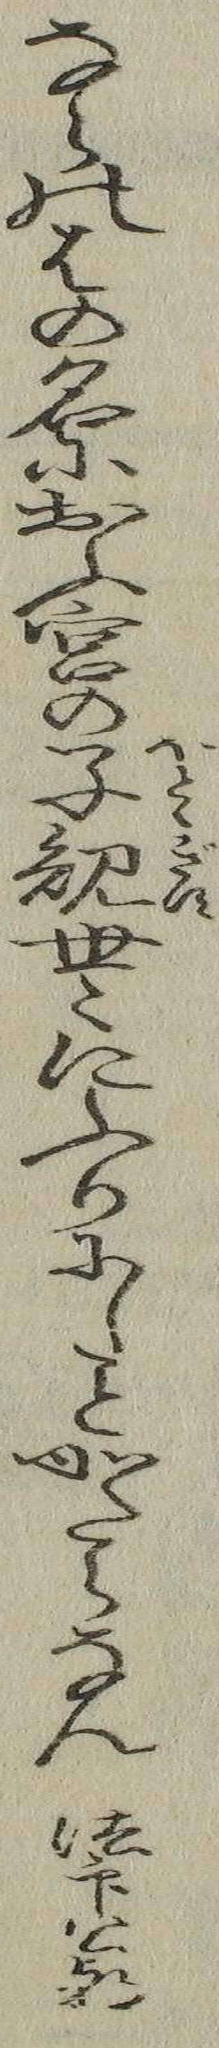ならのはの名におふ宮の子䂓世々にふりにしことかたらなん法印公朝
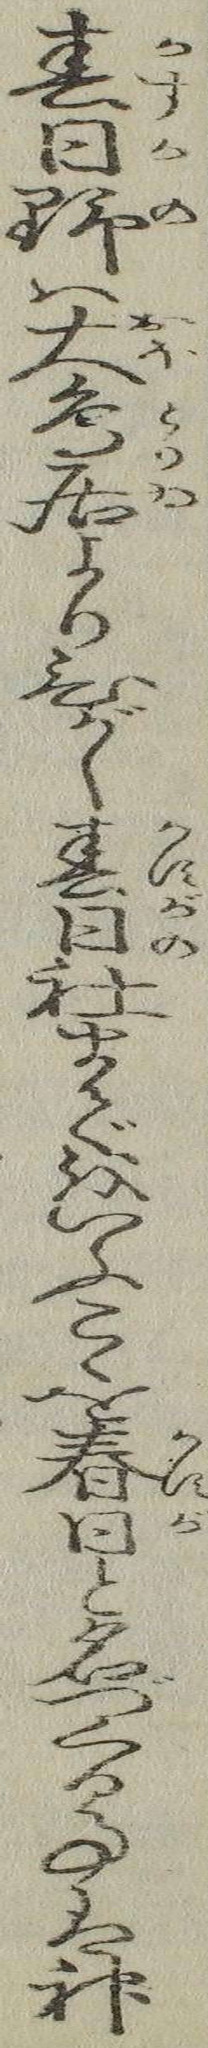春日野は大鳥居よりひがし春日社までをいふこゝを春日と名づくる事は神
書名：大和名所圖會
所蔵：国文学研究資料館
